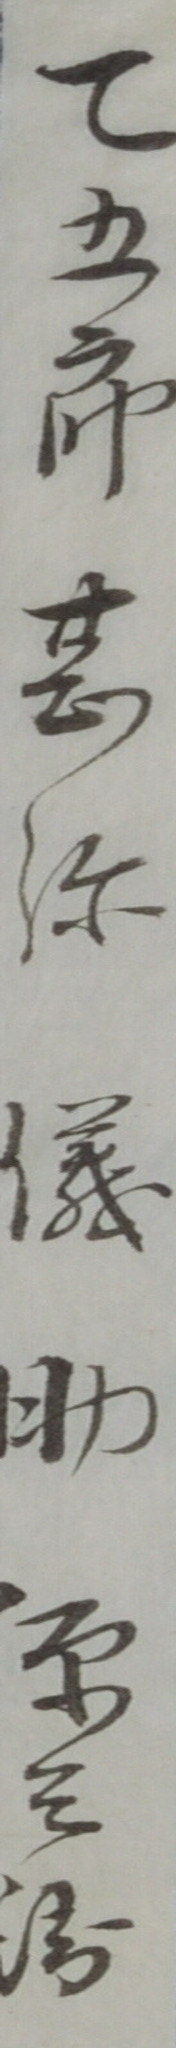乙五郎甚弥儀助源兵衛
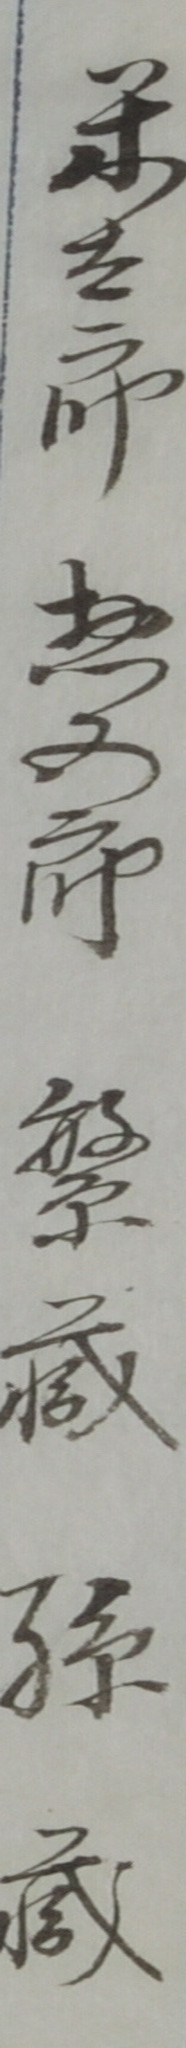米太郎惣五郎繁藏孫蔵
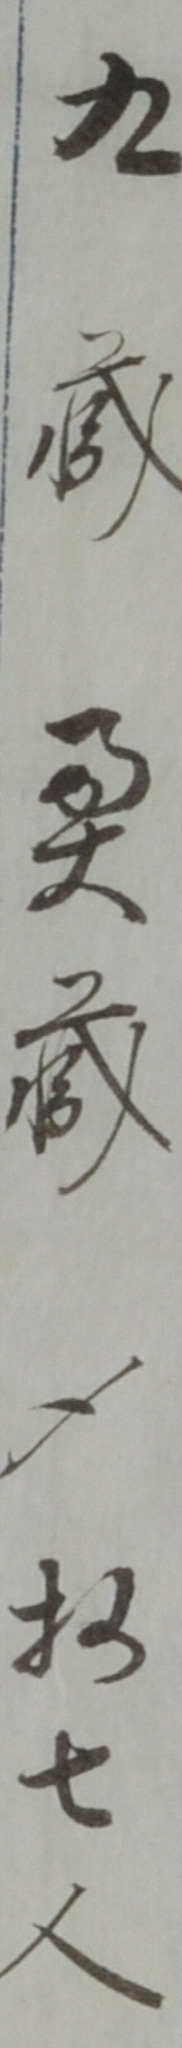九蔵奥蔵〆拾七人
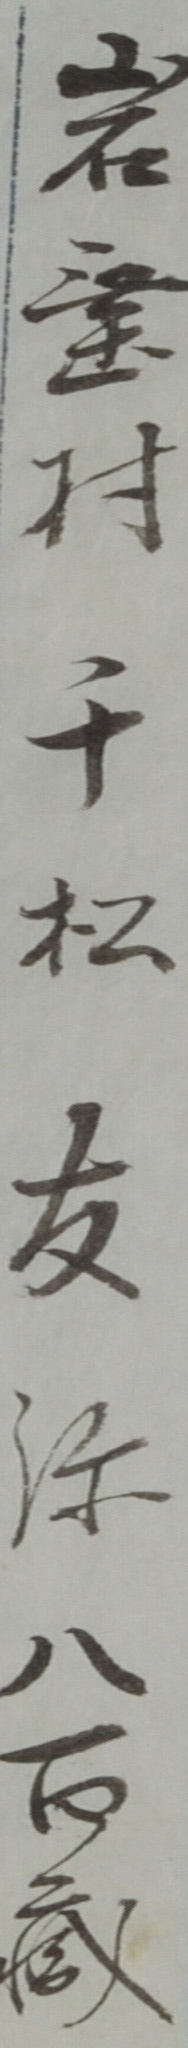岩垂村千松友弥八百蔵
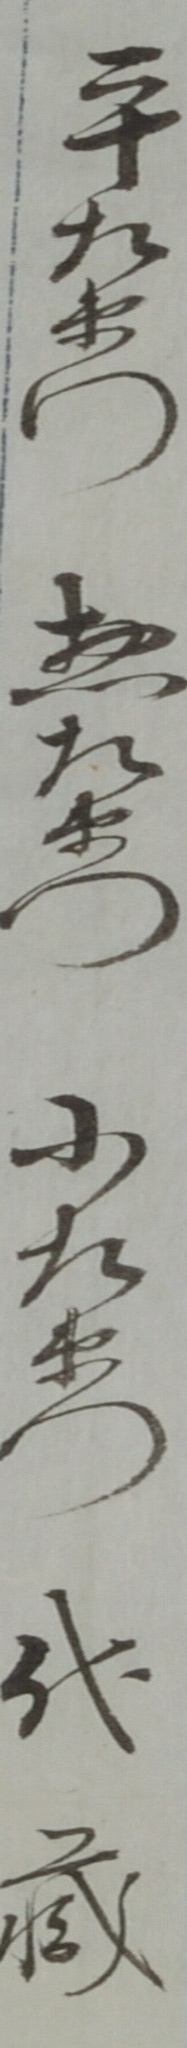平左衛門惣左衛門小左衛門代蔵
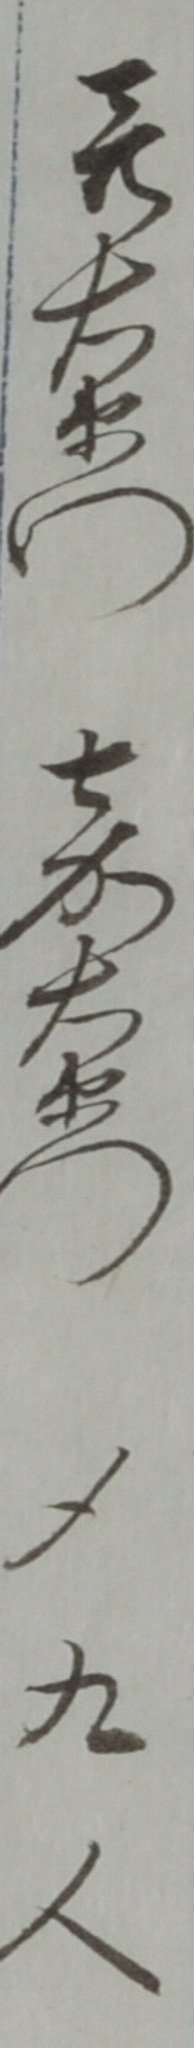喜右衛門嘉右衛門〆九人
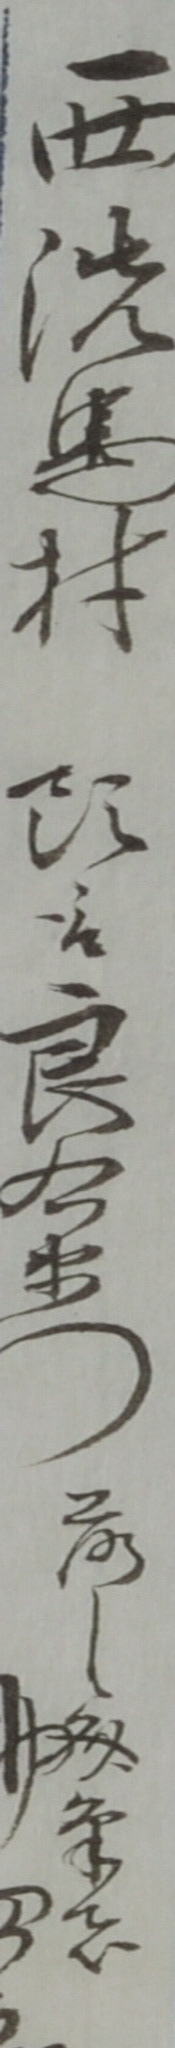西洗馬村頭取良右衛門落し文筆者
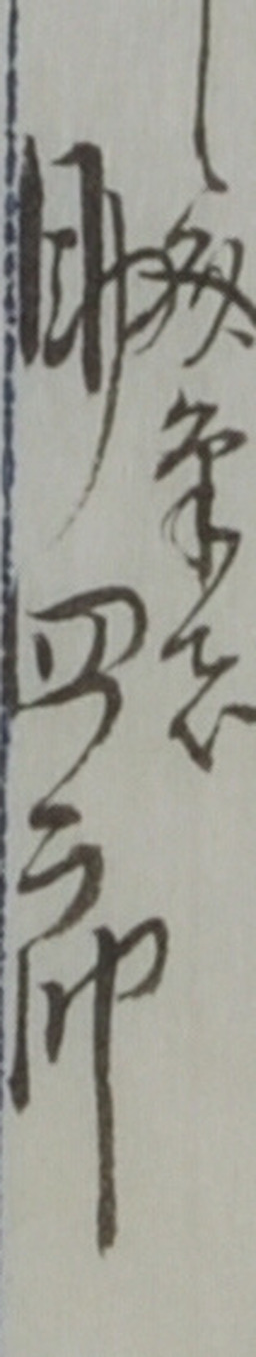助四郎
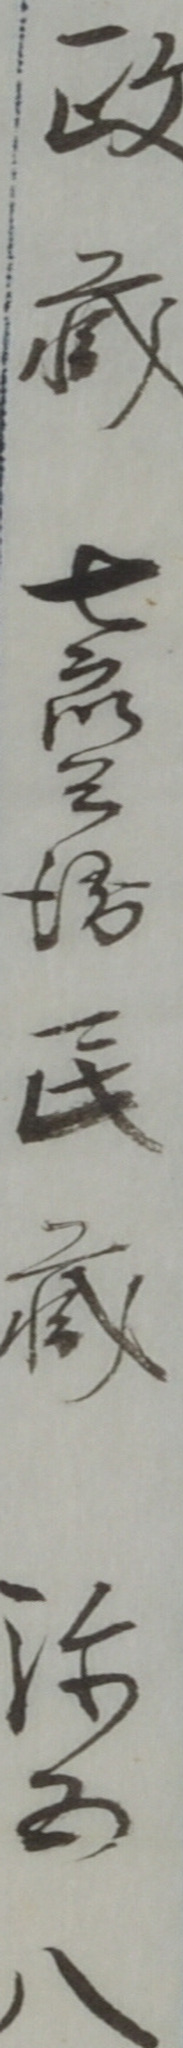政蔵七郎兵衛民藏弥五八
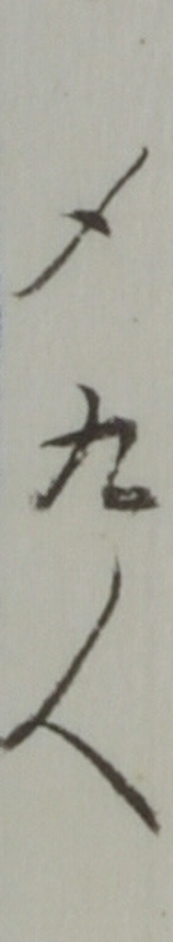〆七人
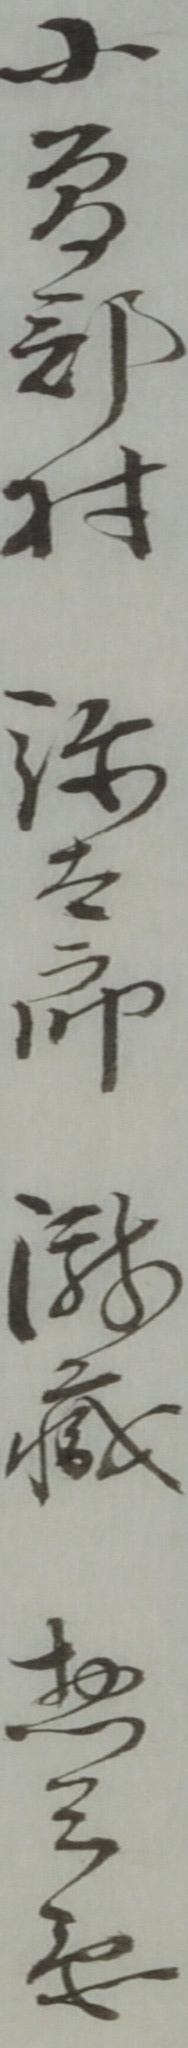小曽部村弥太郎瀧蔵惣兵衛
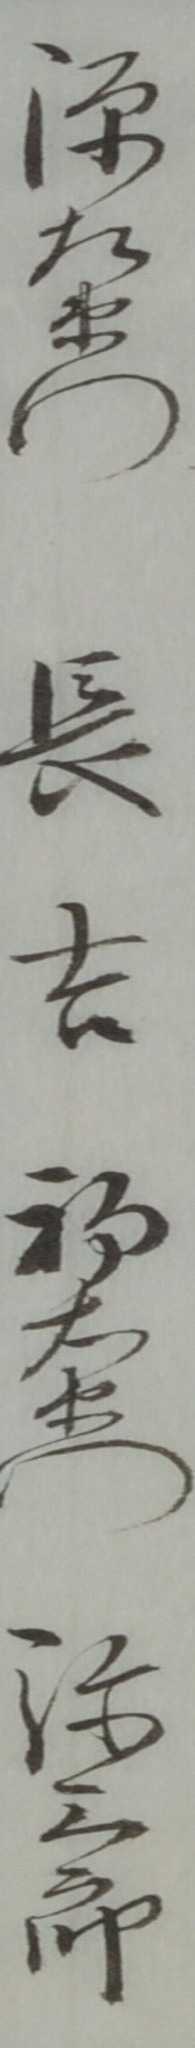源左衛門長吉福右衛門弥三郎
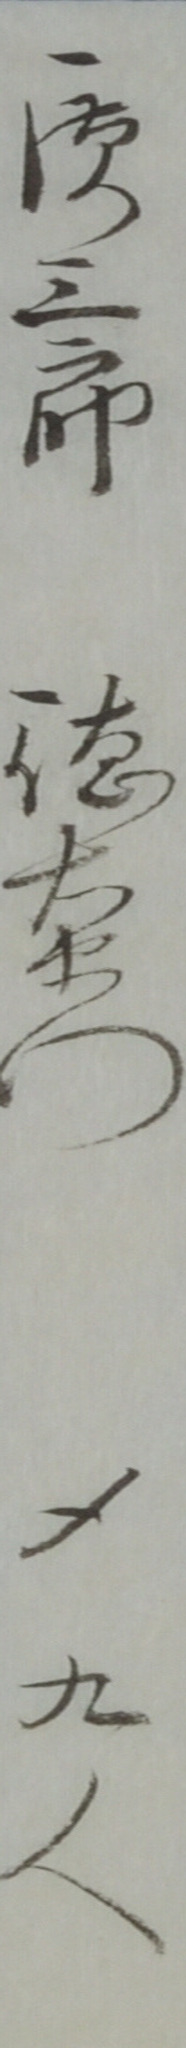広三郎徳右衛門〆九人
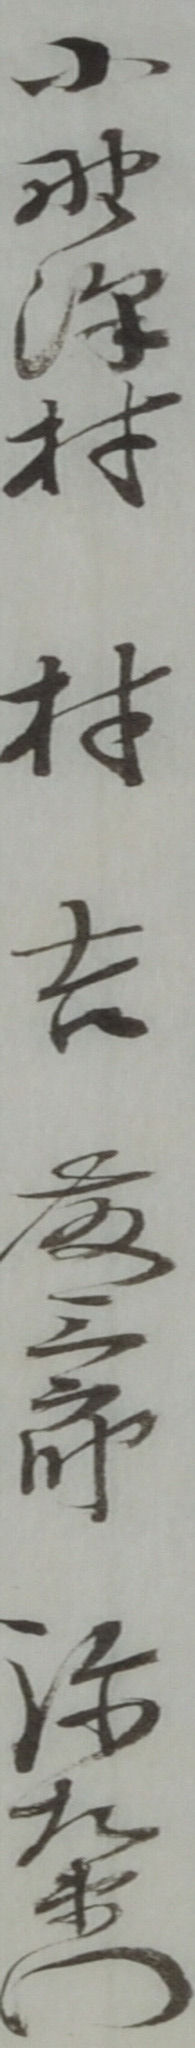小野沢村村吉藤三郎弥左衛門
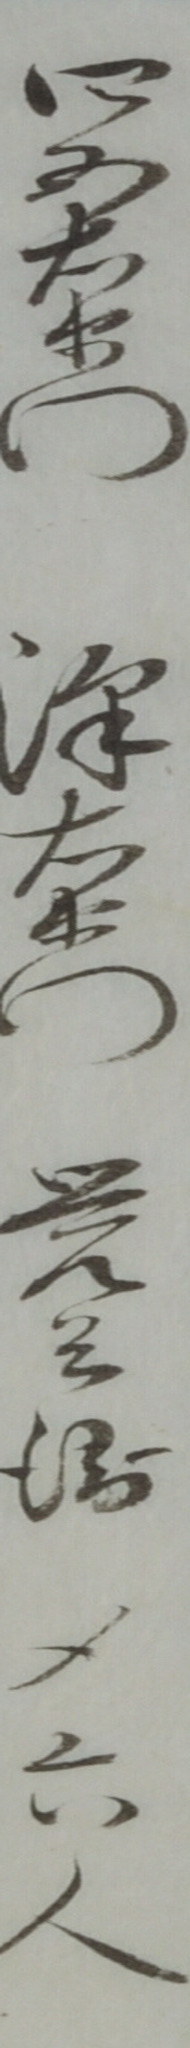四五右衛門沢右衛門覚兵衛〆六人
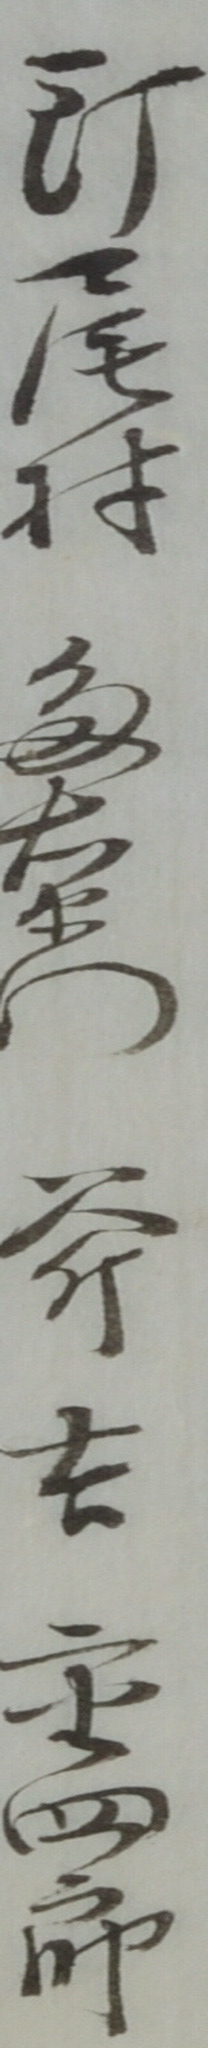釘尾村多右衛門斧吉重四郎
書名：高遠領洗馬騒動一件抜書
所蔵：伊那市立高遠町図書館・合同会社AMANE
